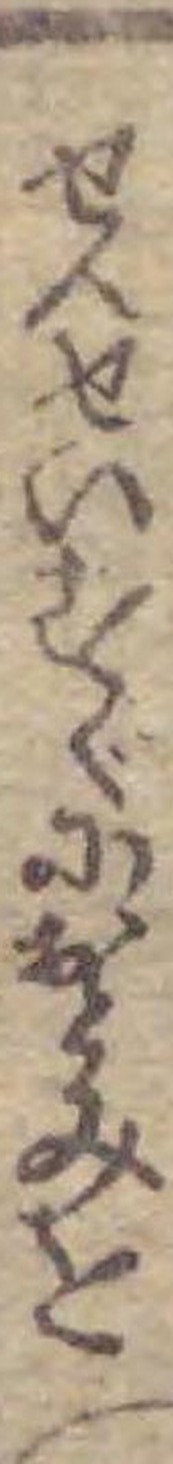せんせいすぐにおとみを
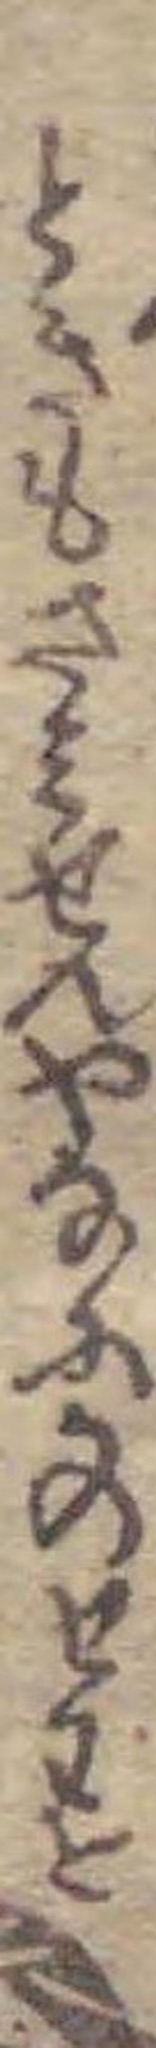ときもさみせんやなにかのせわを
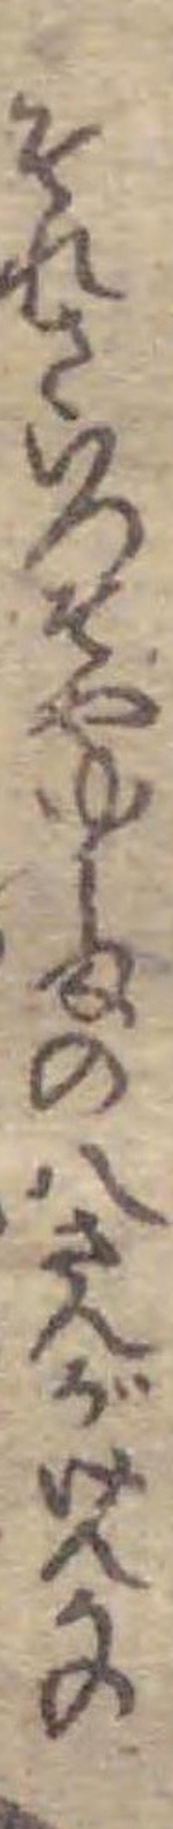それさいつそやゆしまの八さんがけんかの
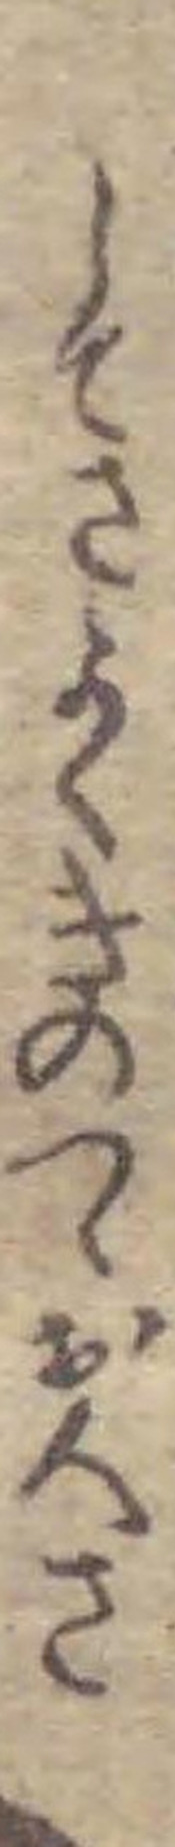してさよくきのつくお人さ
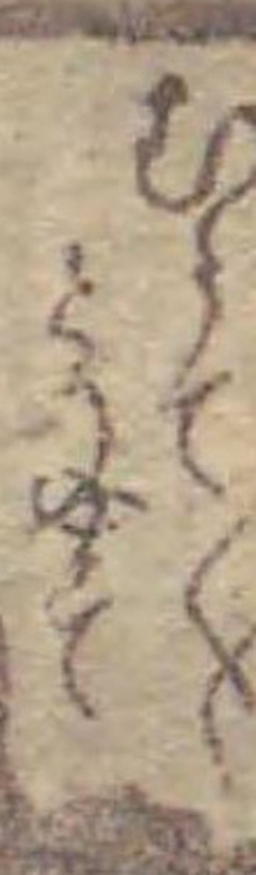とうやす
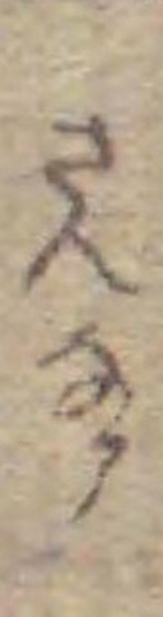さんなァ

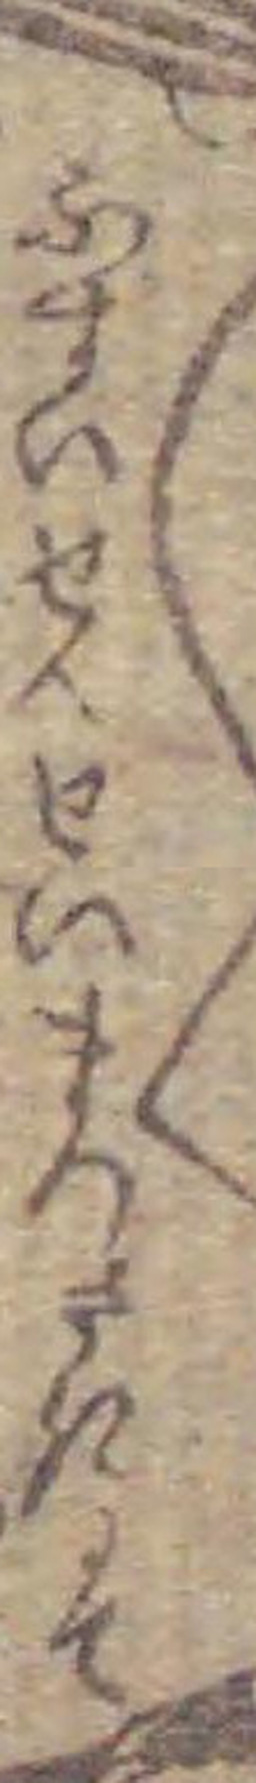ぶすいせんせいまつさきにて
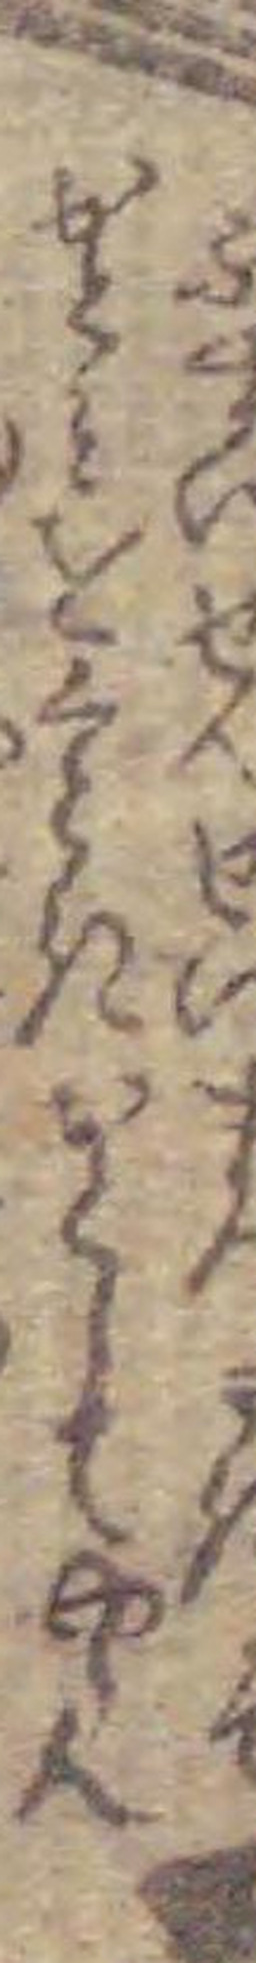おとみをくときおとしてやらん
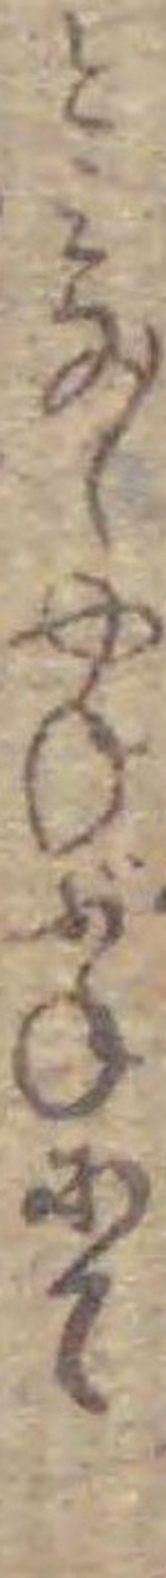とみな〳〵やねぶねにて
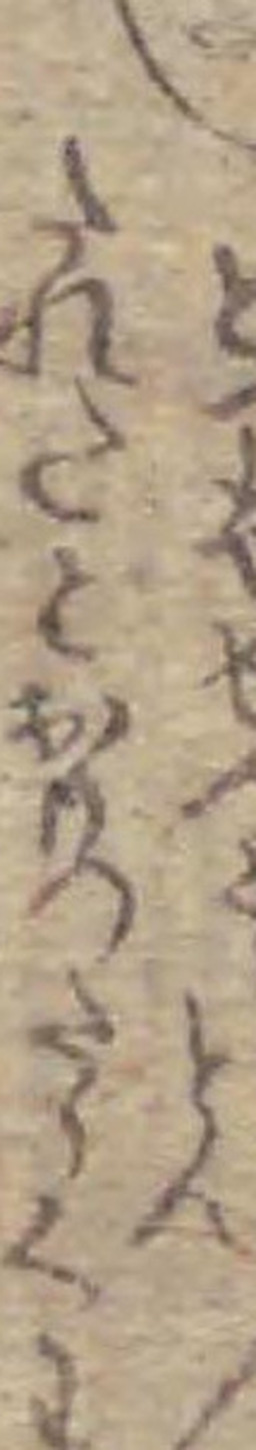たれたとおもつたらくわ
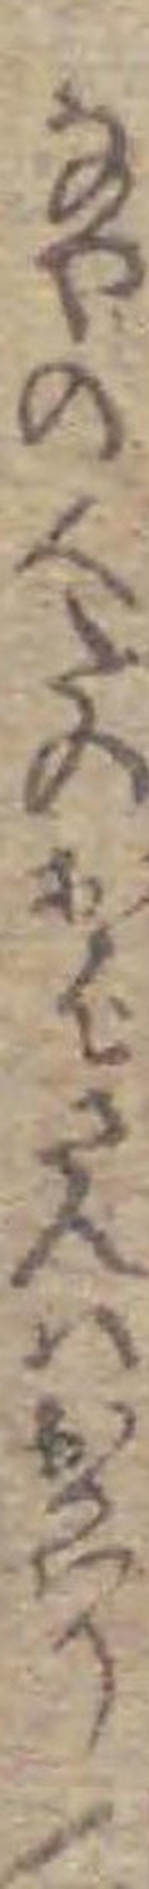なやの人だのおばさんはおかはり
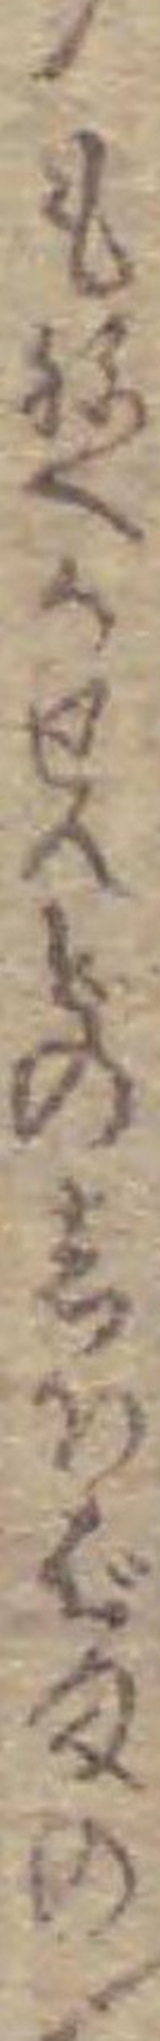もねへかせんどのしほばまの
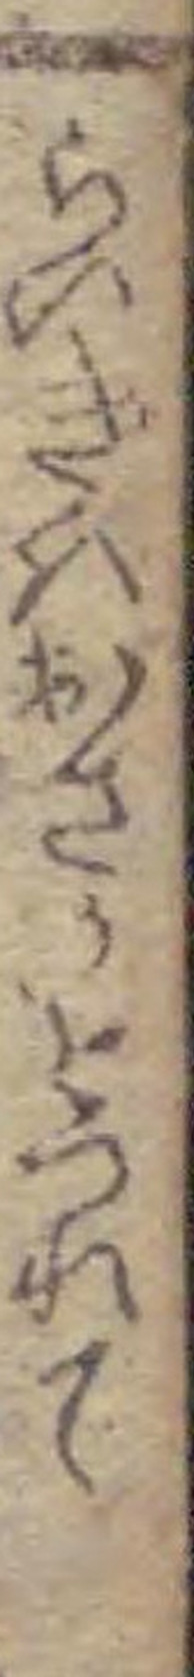らいぎはおさかをつれて
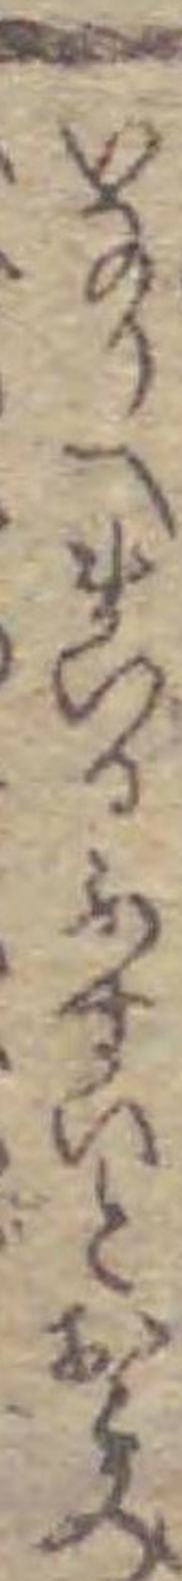いなりへまいるふすいとおとみ
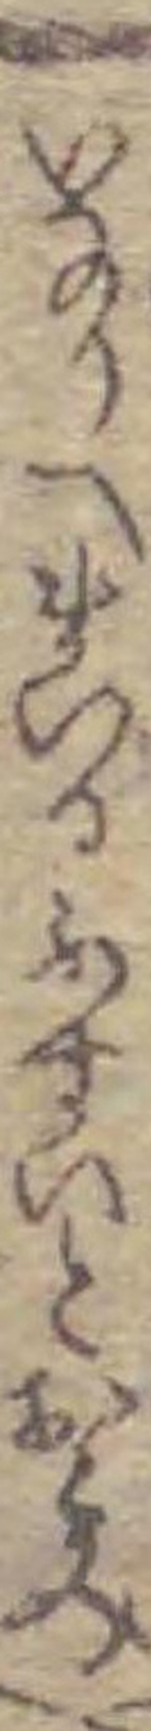いなりへまいるふすいとおとみ
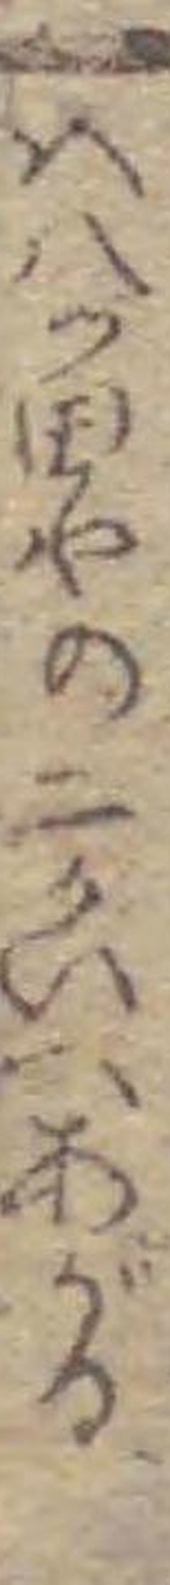は八ツ田やのにかいへあがる
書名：芸者呼子鳥 : 2巻（松泉堂）
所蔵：国立国会図書館 National Diet Library, JAPAN
